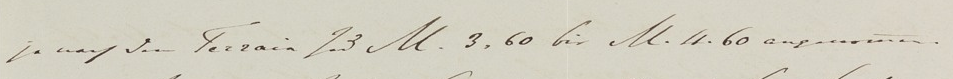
je nach dem Terrain zu M. 3,60 bis M. 4.60 angenommen.
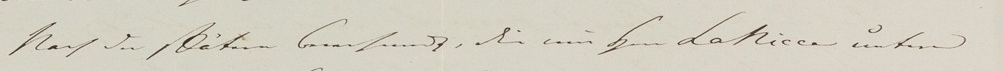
Nach der spätern Berechnung, die mir Herr La Nicca unter
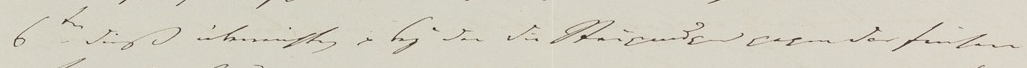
6ten dieß überreichte & bey der die Steigungen gegen das frühere
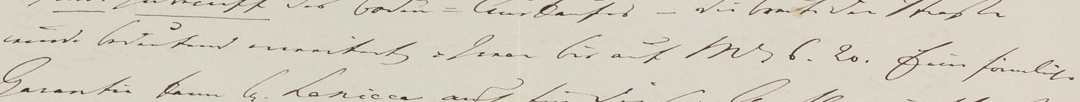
wurde bedeutend erweitert, & zwar bis auf Ms 6.20. Eine förmliche
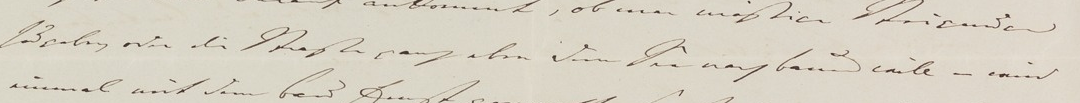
zugeben, oder die Straße ganz eben dem See nach bauen will – wird
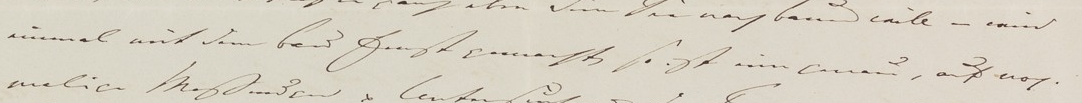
einmal mit dem Bau Ernst gemacht, so ist eine genaue, auf noch-
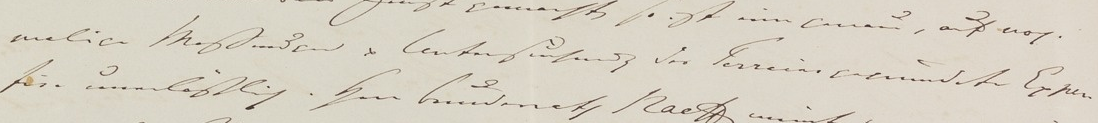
malige Meßungen & Untersuchung des Terrains gegründete Exper-
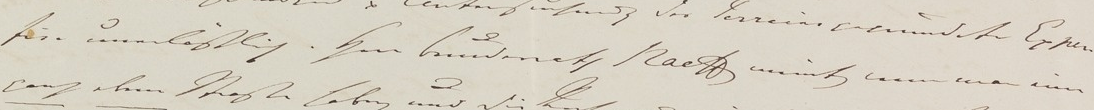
tise unerläßlich. Herr Bundesrath Naeff meint, wenn man eine
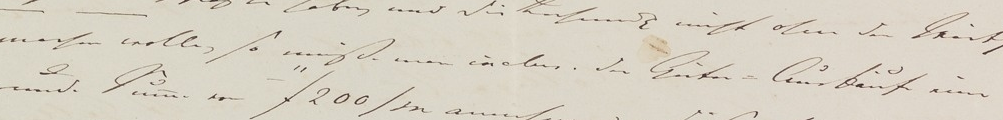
machen wolle, so müße man inclus. den Güter-Auskauf eine
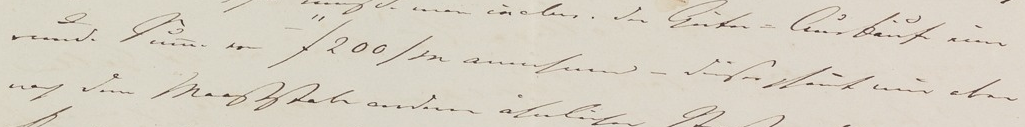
runde Summe von II f 200/m annehmen – dieses scheint mir aber
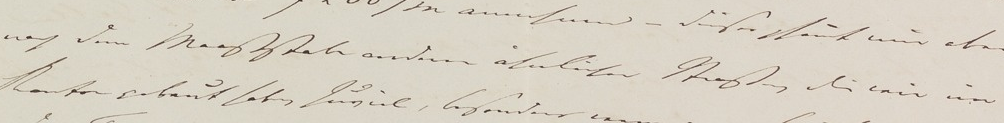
nach dem Maaßstabe anderer ähnlicher Straßen, die wir im
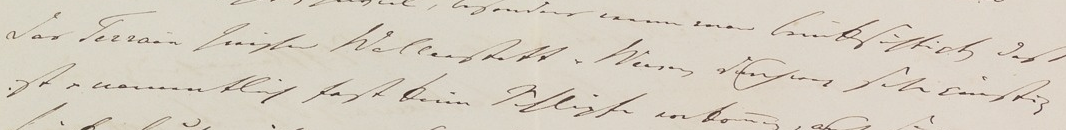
das Terrain zwischen Wallenstatt & Weesen durchaus sehr günstig
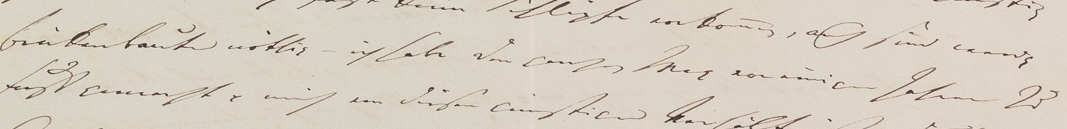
Brükenbauten nöthig – ich habe den ganzen Weg vor einigen Jahren zu
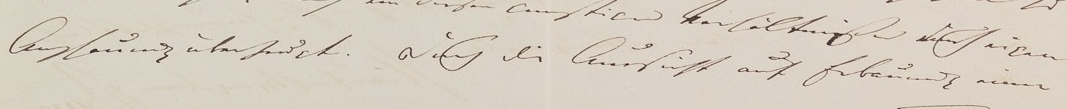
Anschauung überzeugt. Durch die Aussicht auf Erbauung einer
